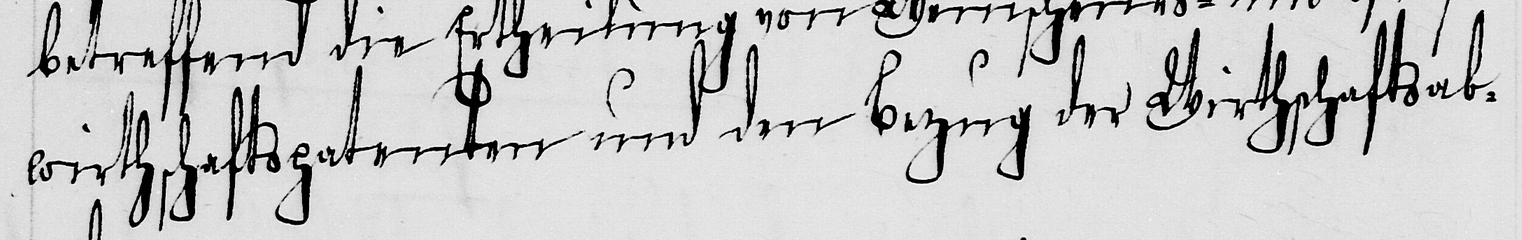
wirthschaftspatenten und den Bezug der Wirthschaftsab¬
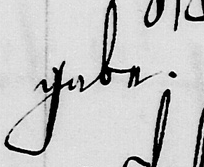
gabe.
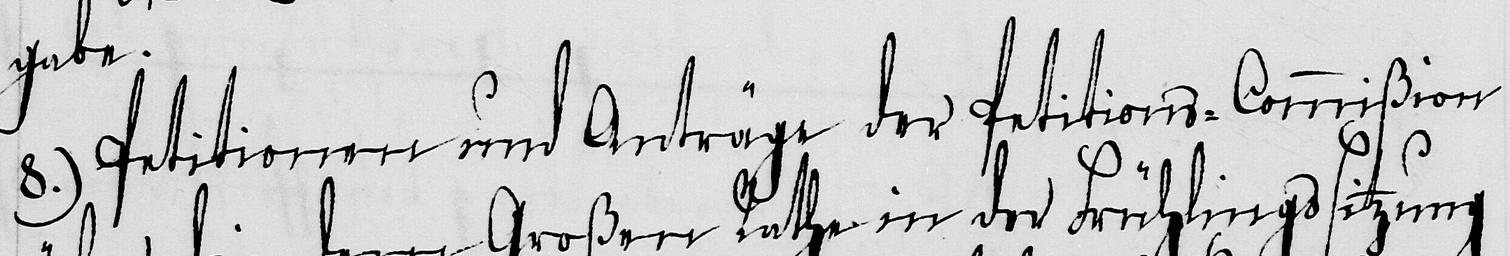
8.) Petitionen und Anträge der Petitions-Commißion
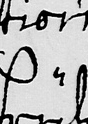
ke.
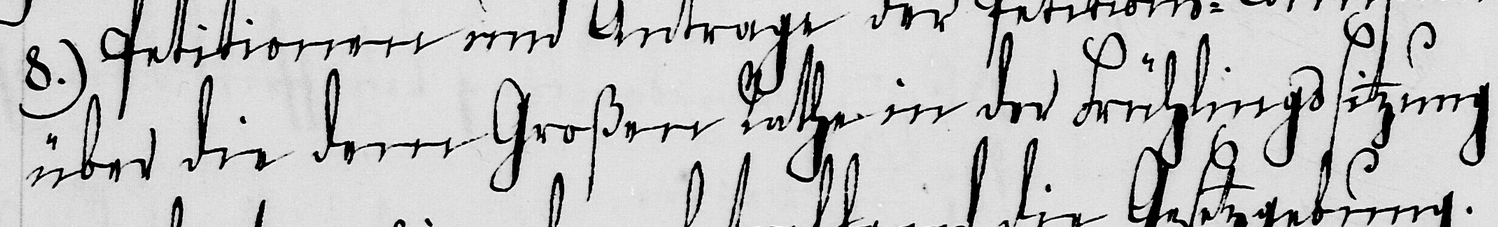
über die dem Großen Rathe in der Frühlingssitzung
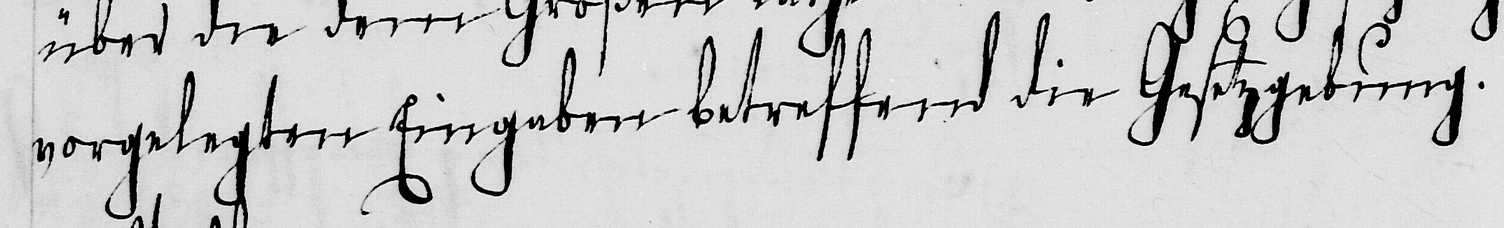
vorgelegten Eingaben betreffend die Gesetzgebung.
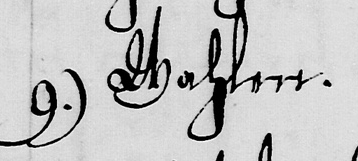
9.) Wahlen.
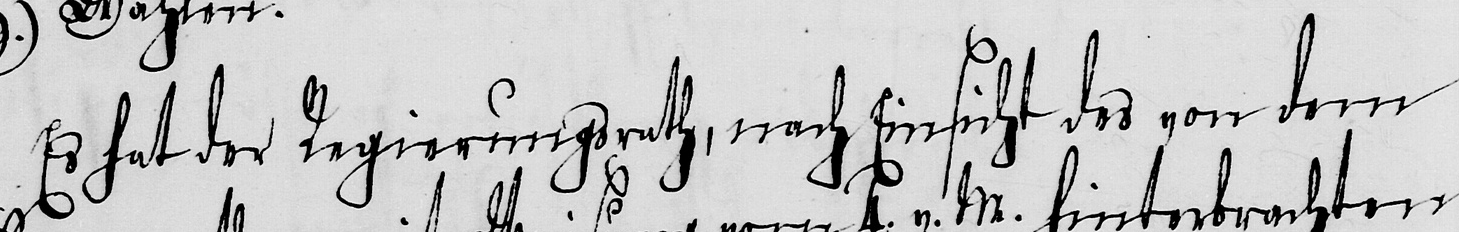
Es hat der Regierungsrath, nach Einsicht des von dem
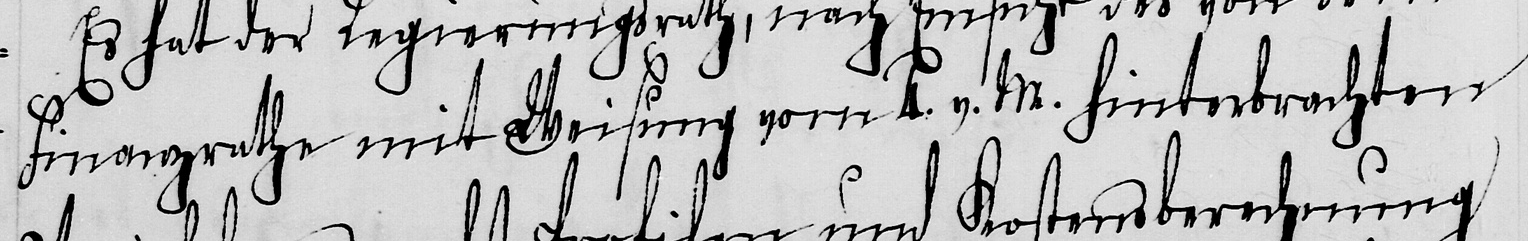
Finanzrathe mit Weisung vom 4. v. M. hinterbrachten
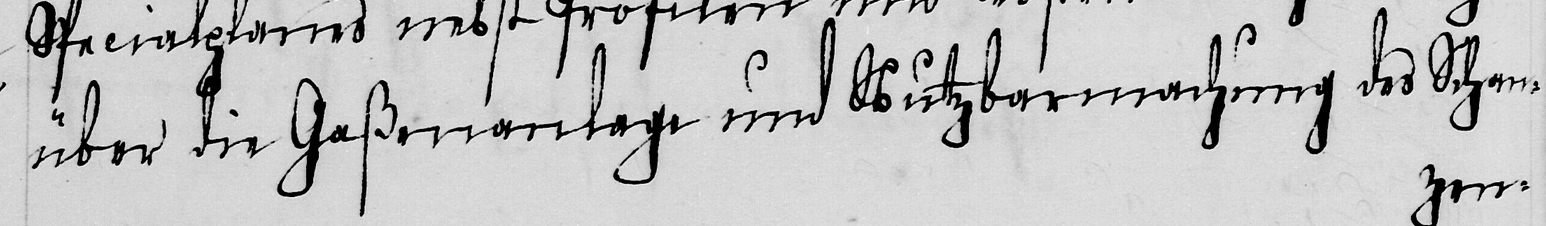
über die Gaßenanlage und Nutzbarmachung des Schan-
